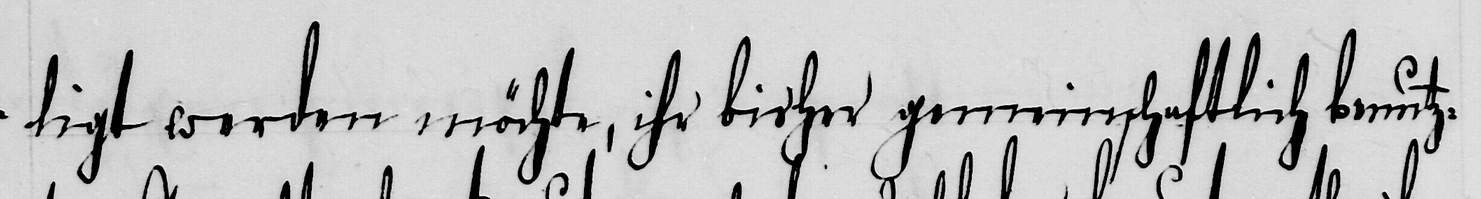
ligt werden möchte, ihr bisher gemeinschaftlich benut¬
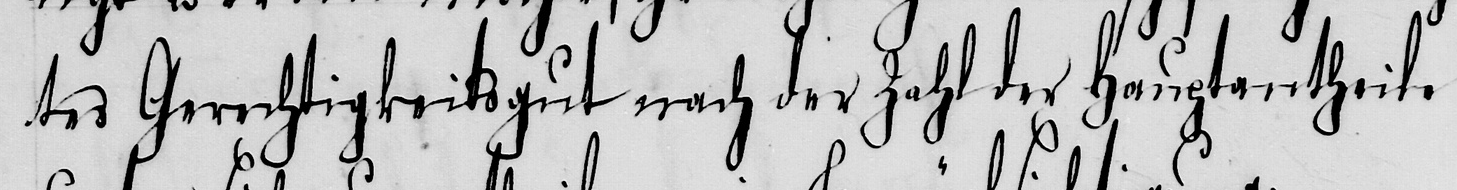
ztes Gerechtigkeitsgut nach der Zahl der Hauptantheile
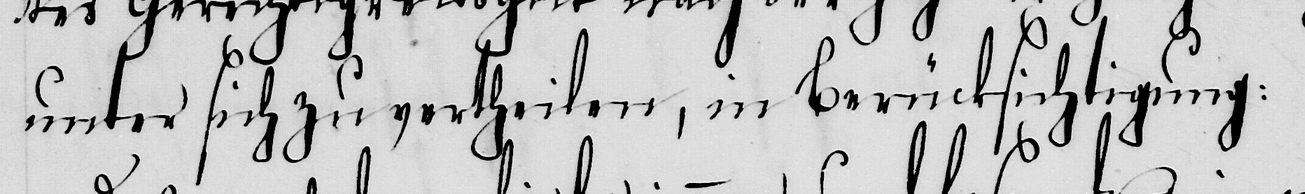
unter sich zu vertheilen, in Berücksichtigung:
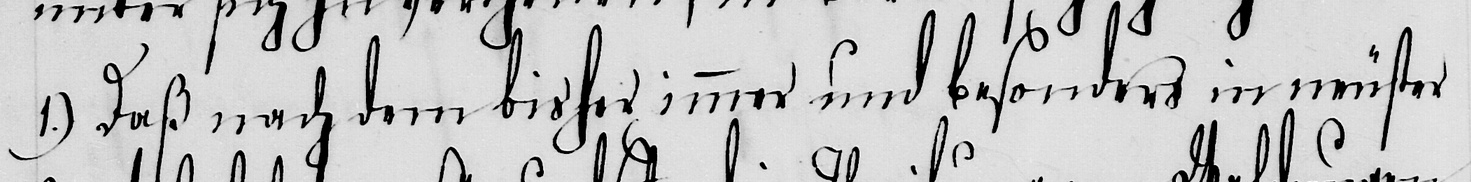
1.) Daß nach dem bisher immer und besonders in neuster
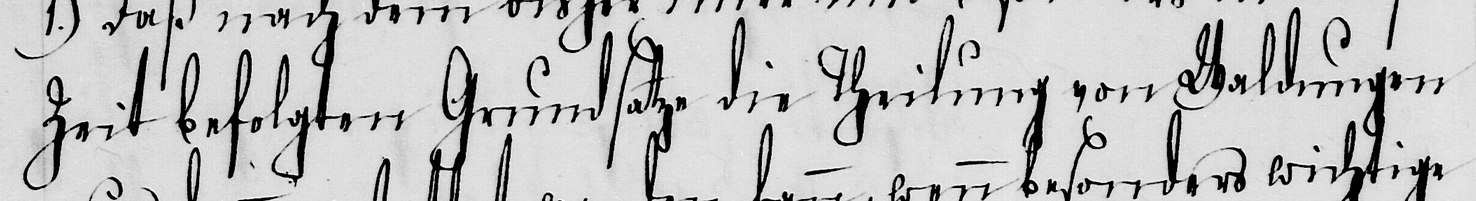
Zeit befolgten Grundsatze die Theilung von Waldungen
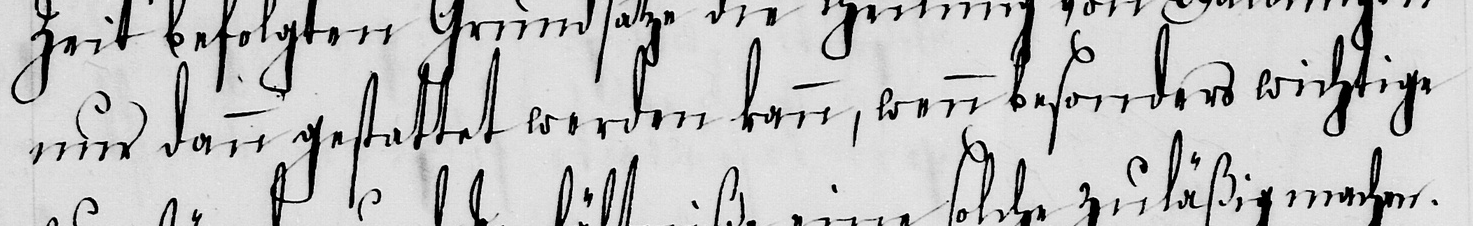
nur dann gestattet werden kann, wenn besonders wichtige
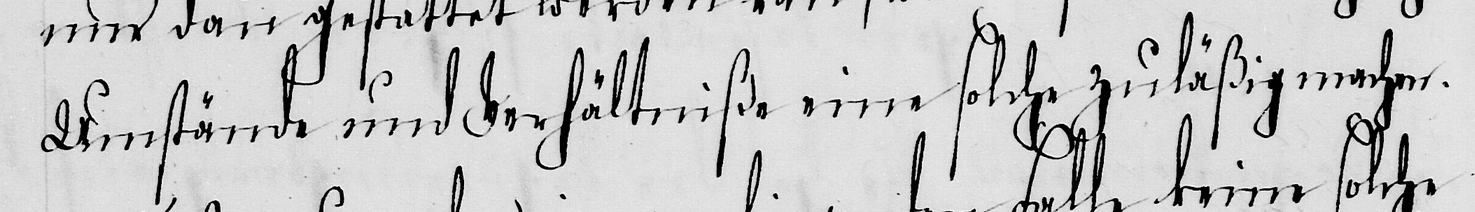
Umstände und Verhältniße eine solche zuläßig machen.
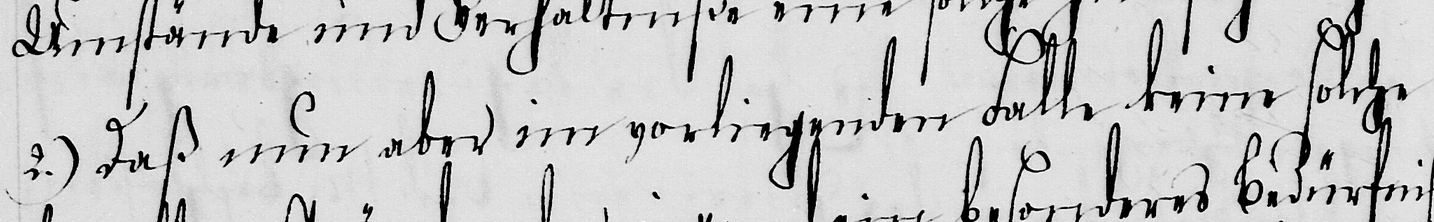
2.) Daß nun aber im vorliegenden Falle keine solche
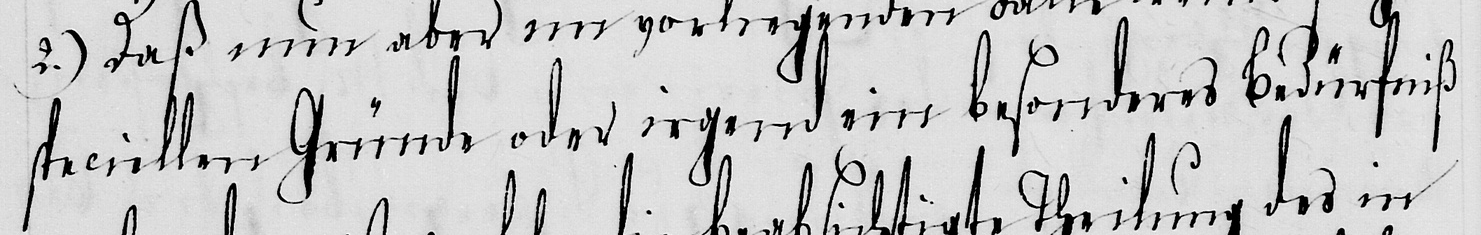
speciellen Gründe oder irgend ein besonderes Bedürfniß
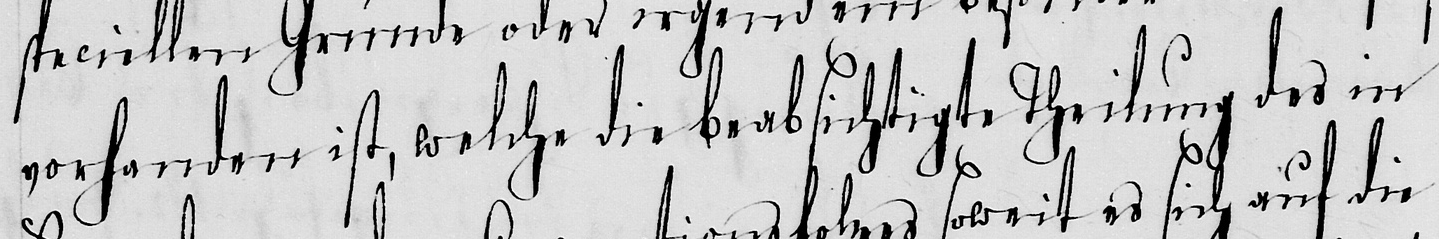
vorhanden ist, welche die beabsichtigte Theilung des in
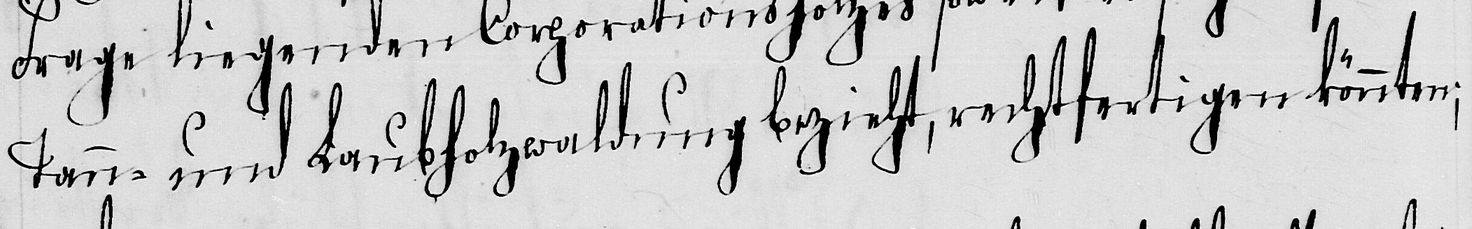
Tann- und Laubholzwaldung bezieht, rechtfertigen
